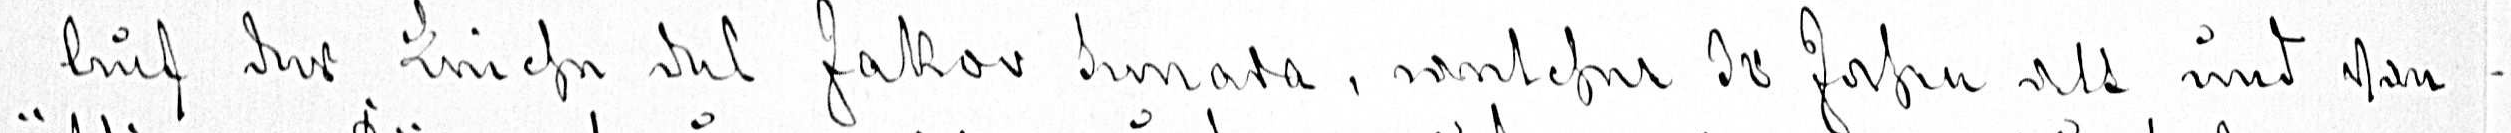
Auf der Leiche des Jakov Iunara, welche 38 Jahre alt und von
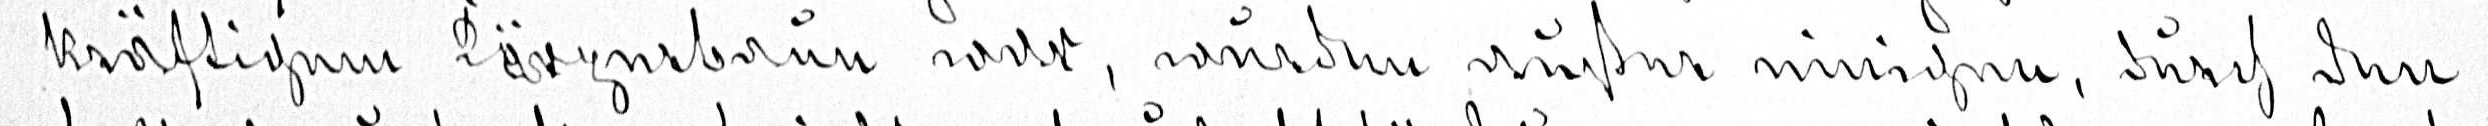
kräftigem Körperbaum war, wurden außer einigen, durch den
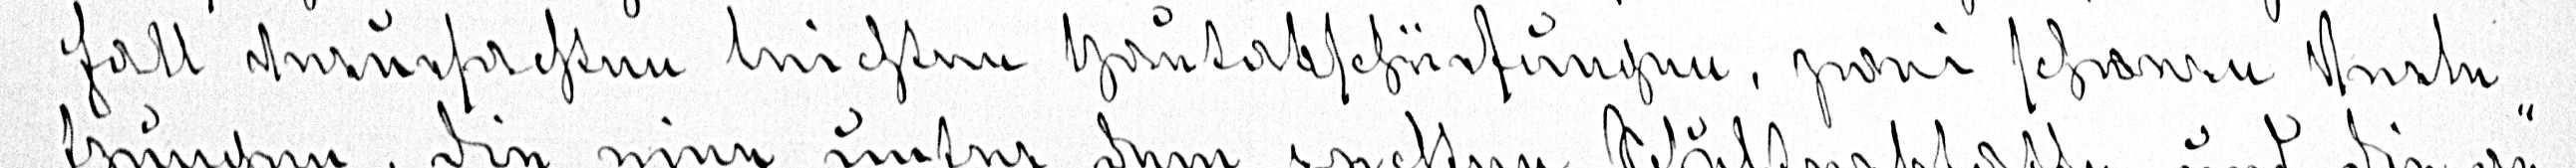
Fall verursachten leichten Hauptabschürfungen, zwei schwere Verle¬
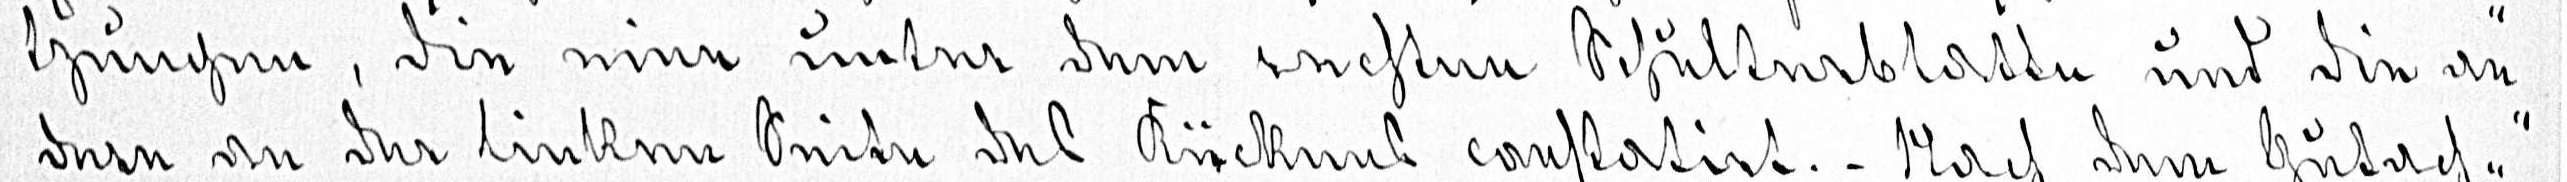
tzungen, die eine unter dem reichten Schulterblatte und die an¬
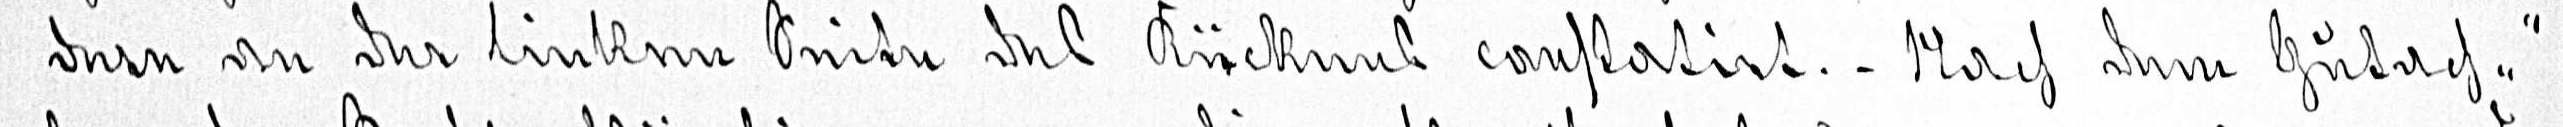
dere an der linken Seite des Rückens constatirt. Nach dem Gutach¬
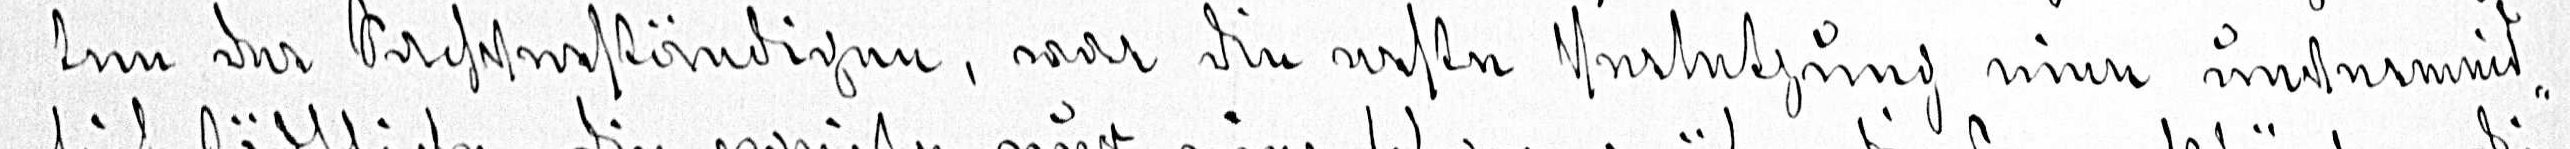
ten der Sachverständigen, war die erste Verletzung eine unvermeid¬
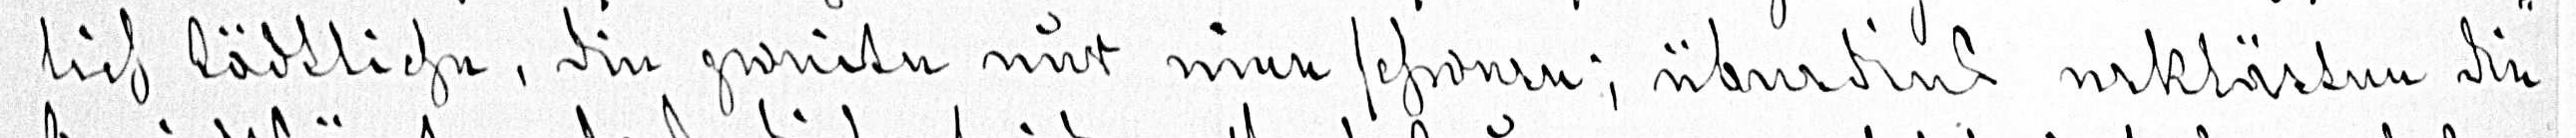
lich tödtliche, die zweite nur eine schwere; überdies erklärten die
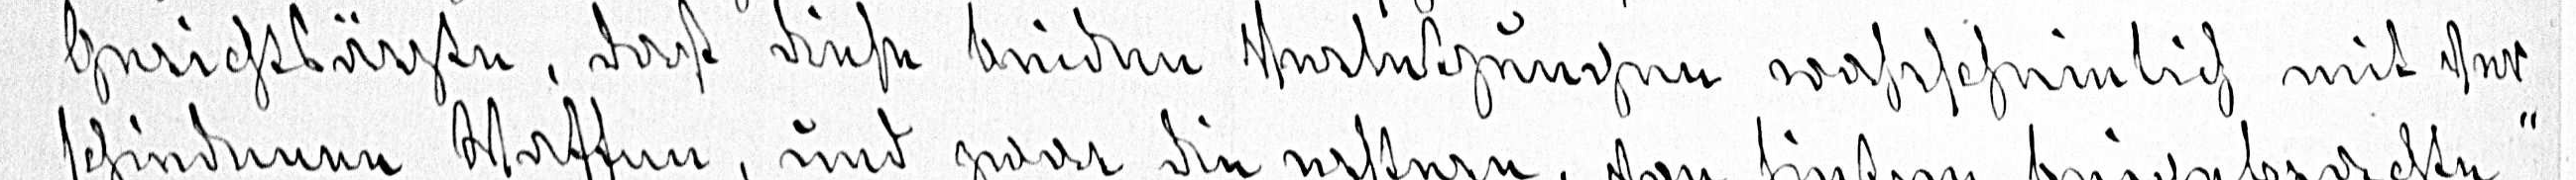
Gerichtsärzte, daß diese beiden Verletzungen wahrscheinlich mit ver¬
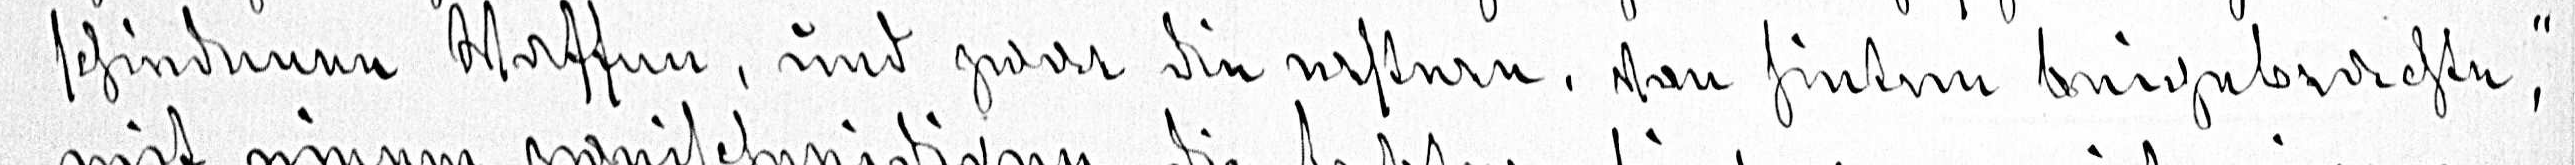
schiedenen Waffen, und zwar die erstere, von hintem beigebrachte,
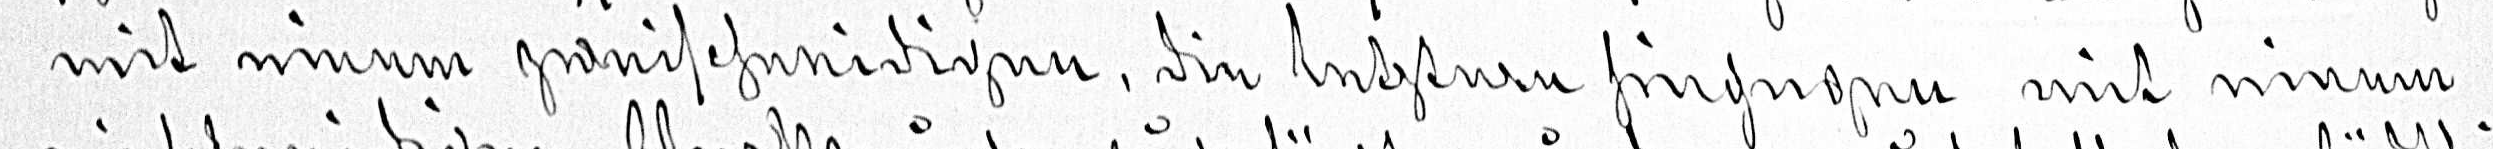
mit einem zweischneidigen, die letztere hingegen mit einem
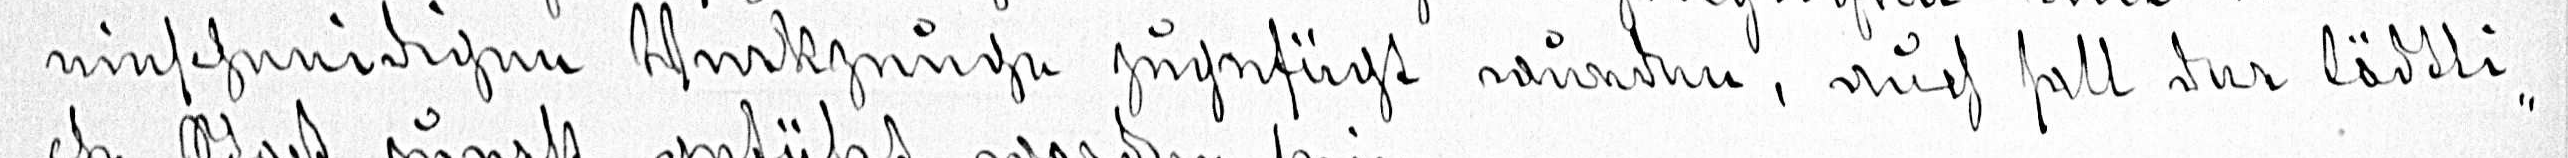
einschneidigen Werkzeuge zugefügt wurden, auch soll der tödli¬
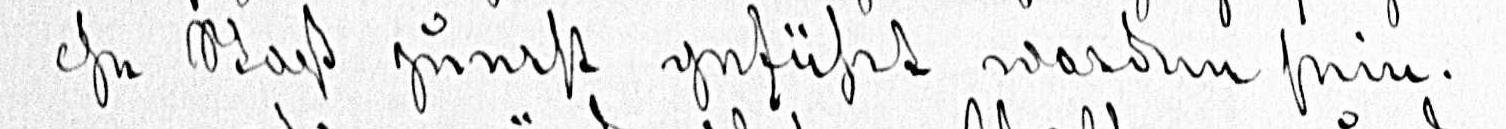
che Stoß zuerst geführt worden sein.
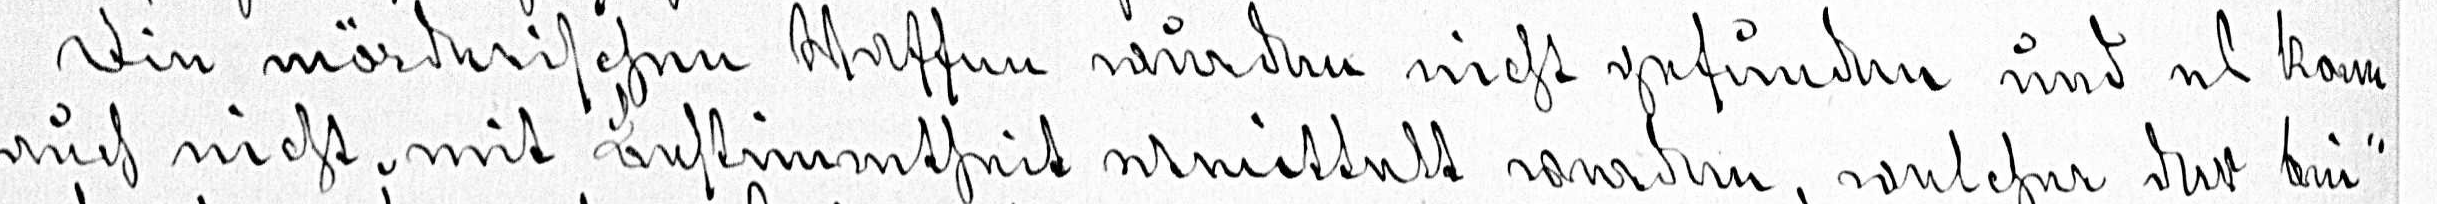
Die mörderischen Waffen wurden nicht gefunden und es konn¬
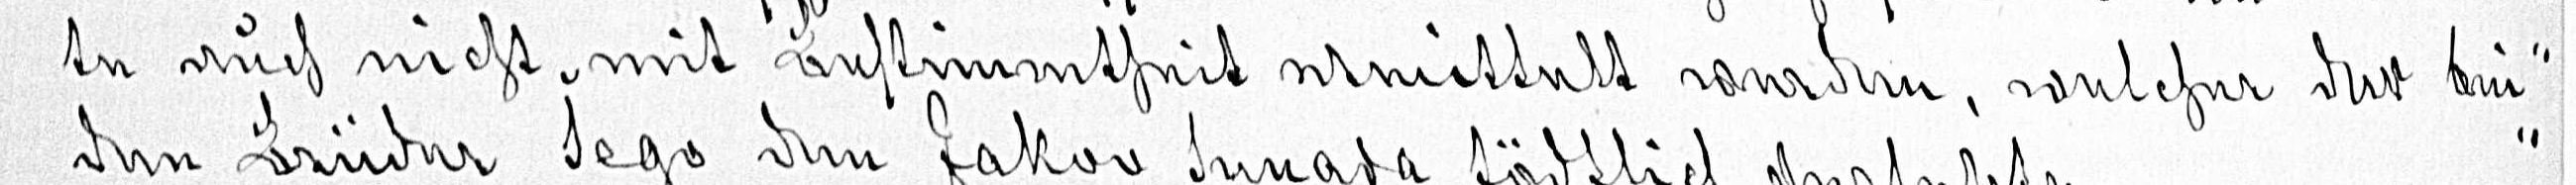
te auch nicht mit Bestimmtheit ermittelt werden, welcher der bei¬
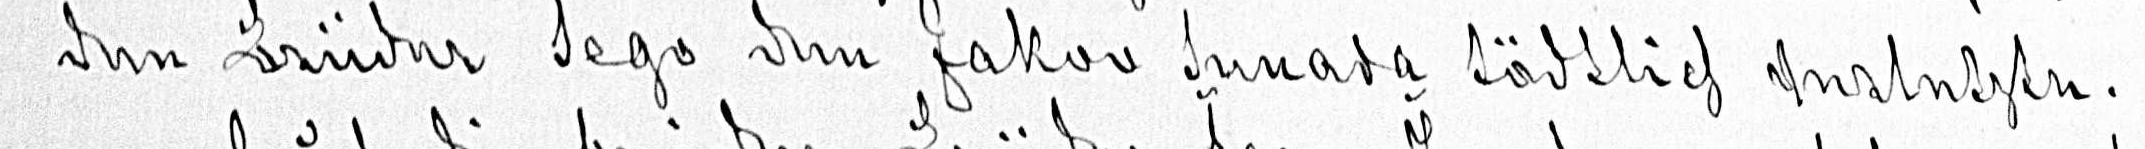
den Brüder Šego den Jakov Iunara tödlitch verletzte.
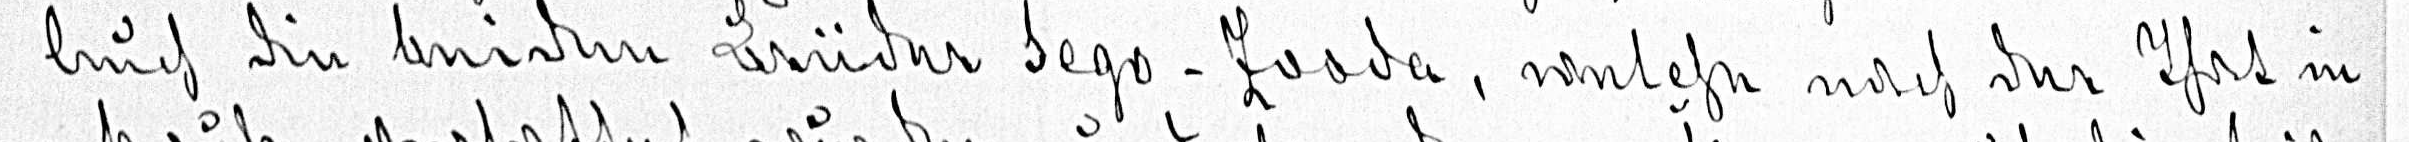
Auch die beiden Brüder Šego-Žvoda, welche nach der That in
